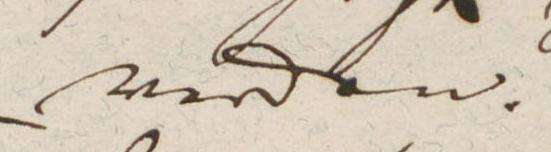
% werden.
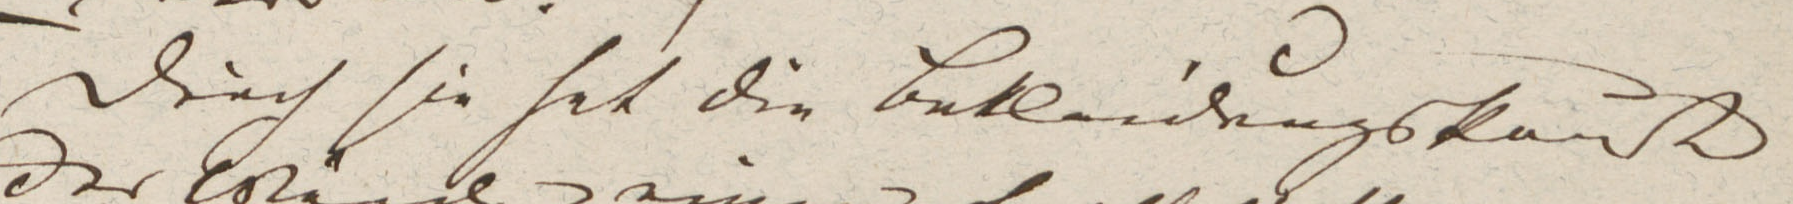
Durch sie hat die Bekleidungskunst
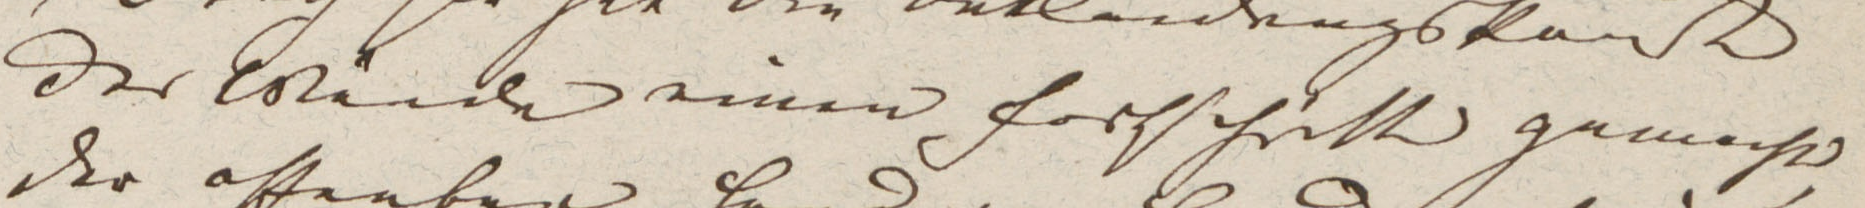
der Wände einen Fortschritt gemacht,
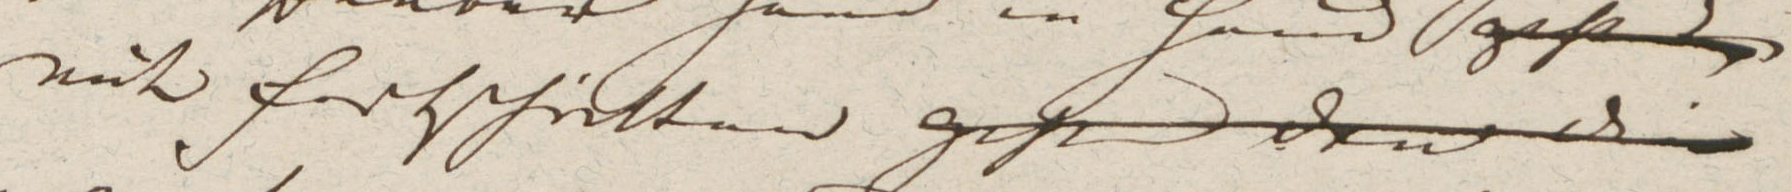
mit Fortschritten geht den die
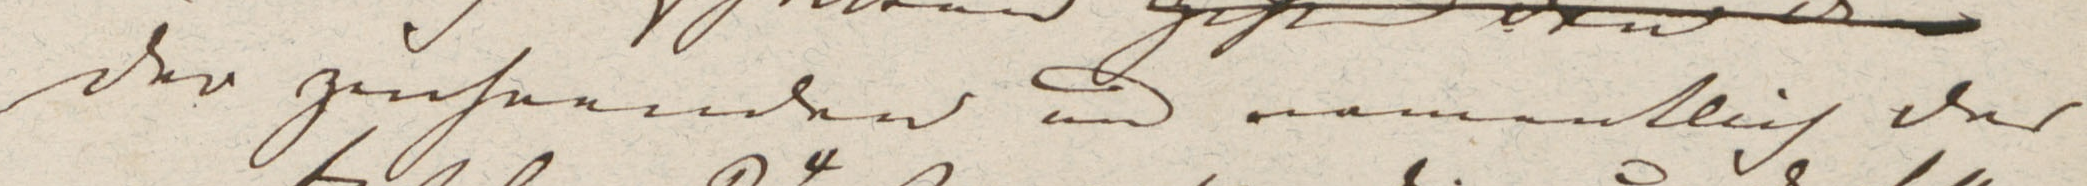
der zeichnenden und namentlich der
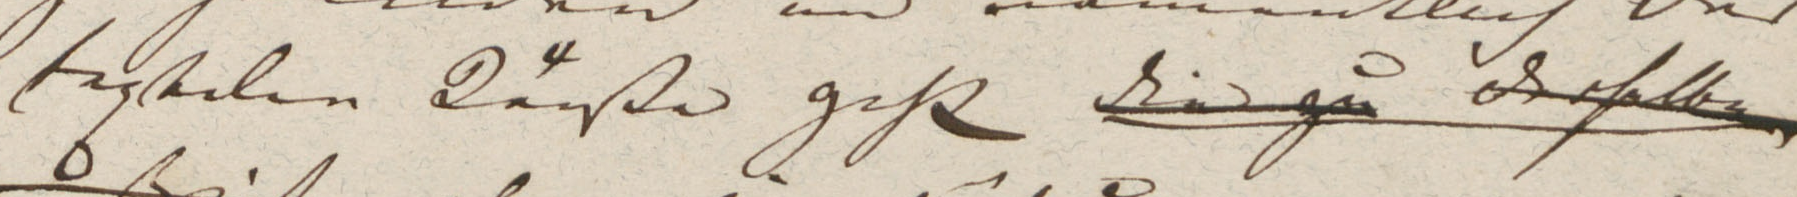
textilen Künste geht die zu derselben
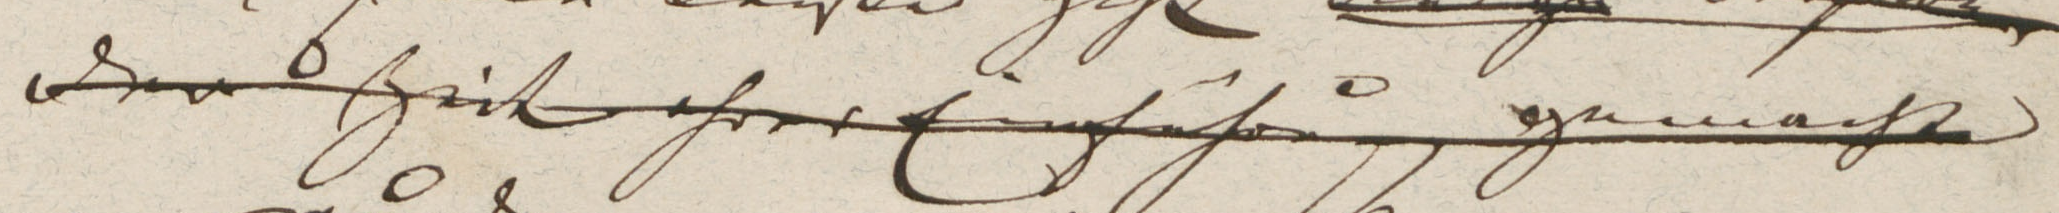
der Zeit ihrer Einführung gemacht
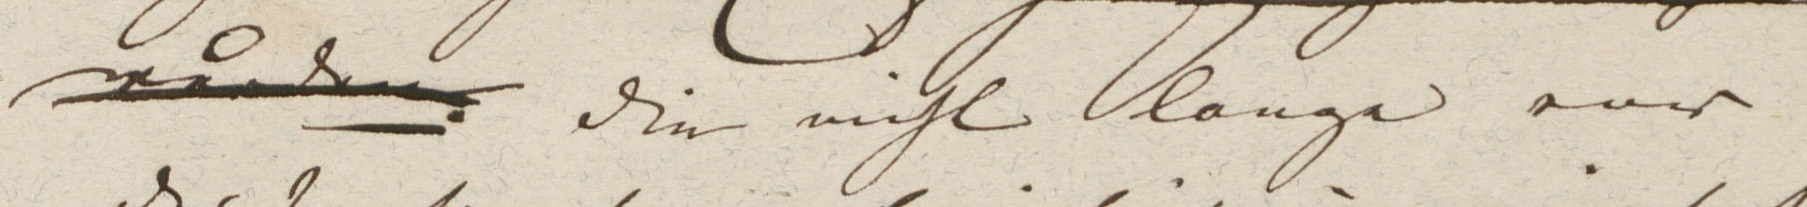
wurden. die nicht lange vor
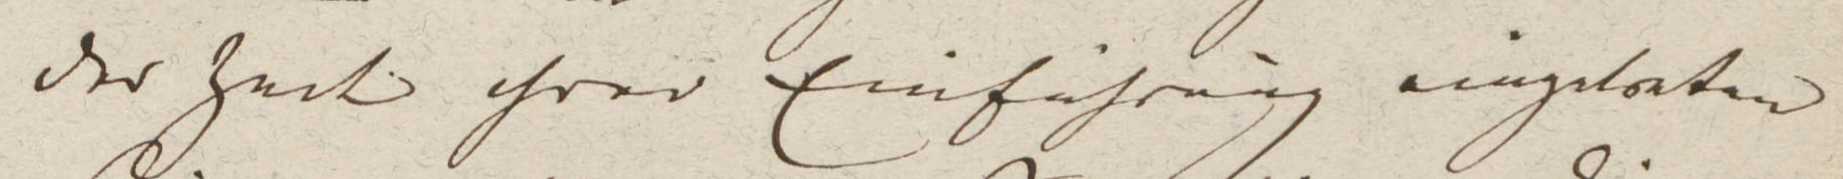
der Zeit ihrer Einführung eingetreten
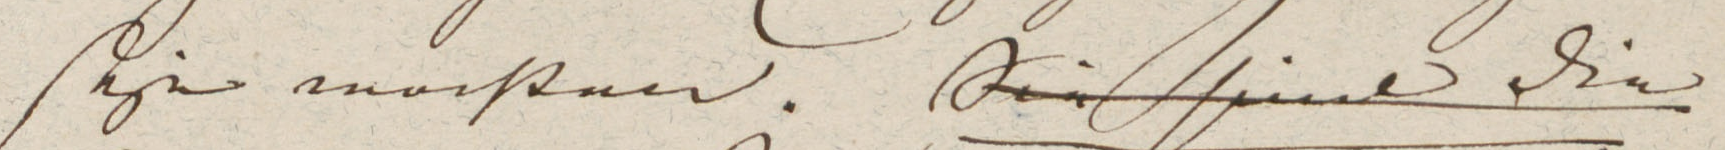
seyn mochten. Sie sind die
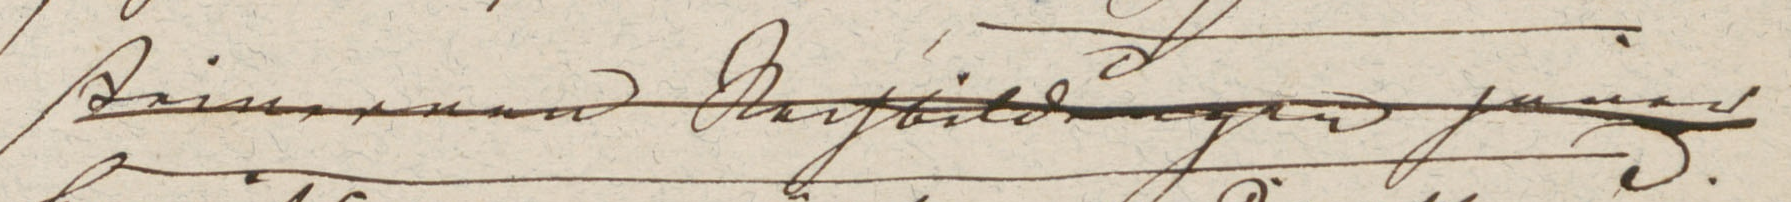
steinernen Nachbildungen jener
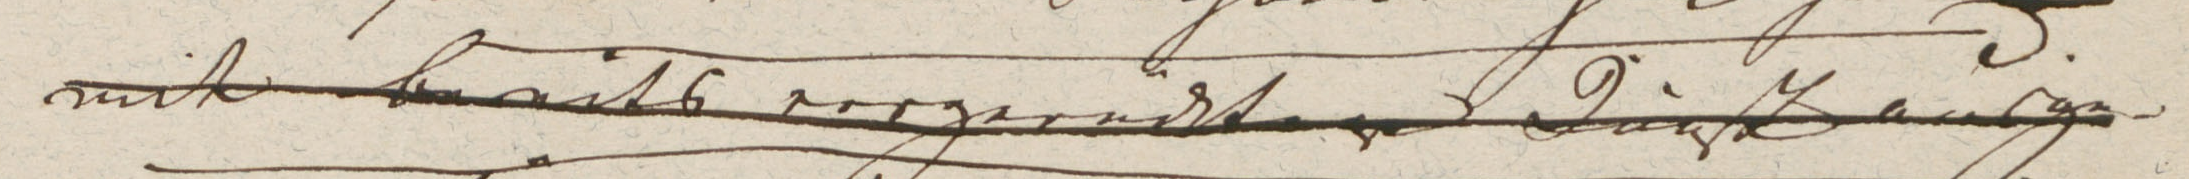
mit bereits verogerückter Kunst ausge-
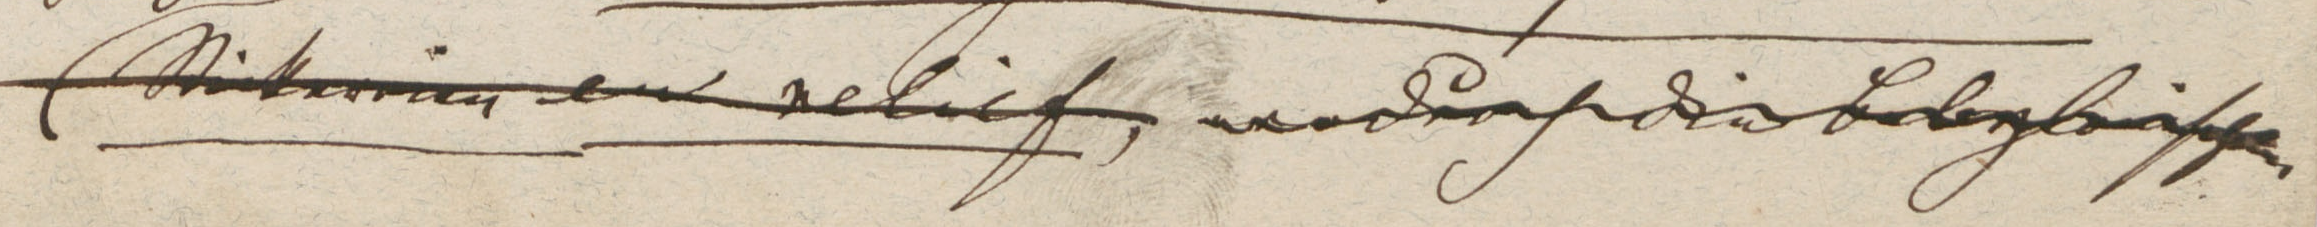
%Stickereien en relief, wodurch die Babylonischen
